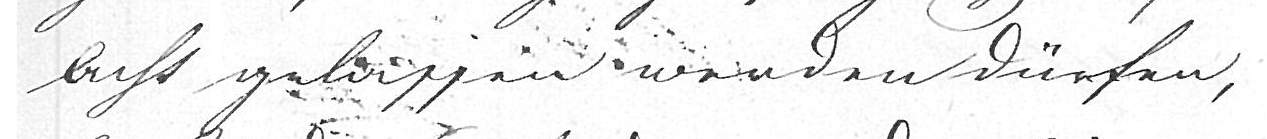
Acht verlassen werden dürfen,
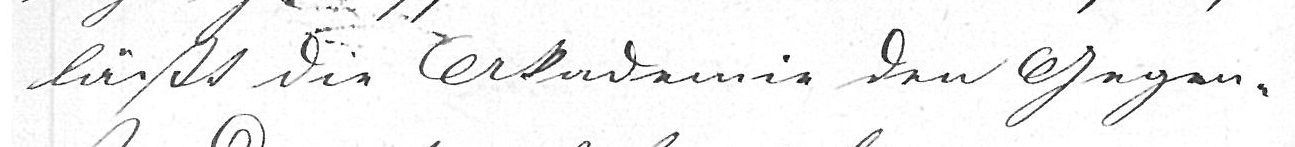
läßt die Akademie den Gegen-
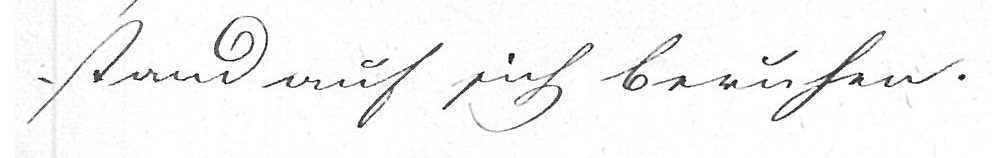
stand auf sich beruhen.
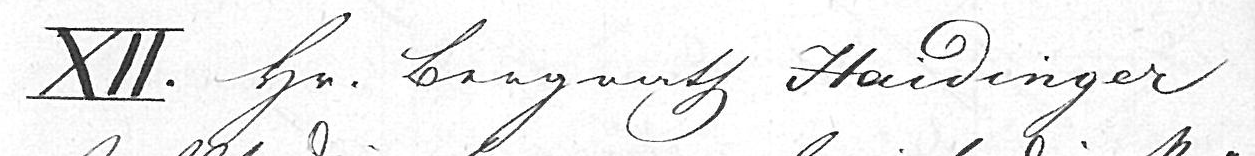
XII. Hr. Bergrath Haidinger
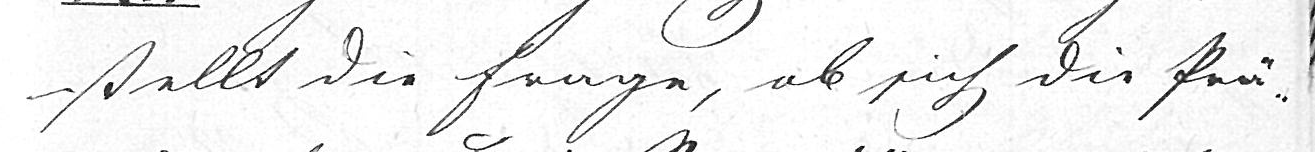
stellt die Frage, ob sich die Prä-
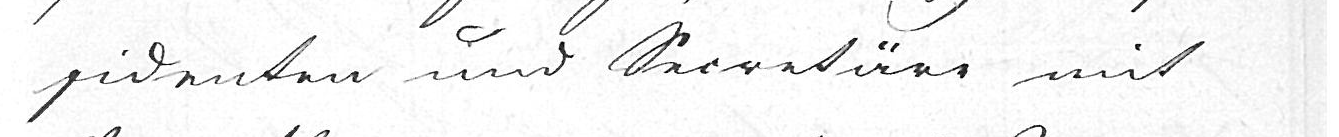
sidenten und Secretärs mit
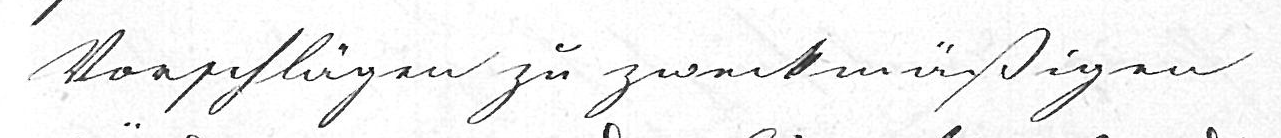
Vorschlägen zu zweckmäßigen
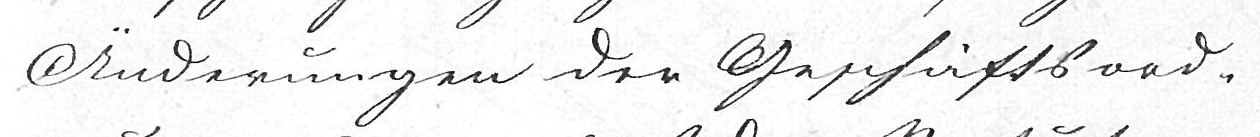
Änderungen der Geschäftsord-
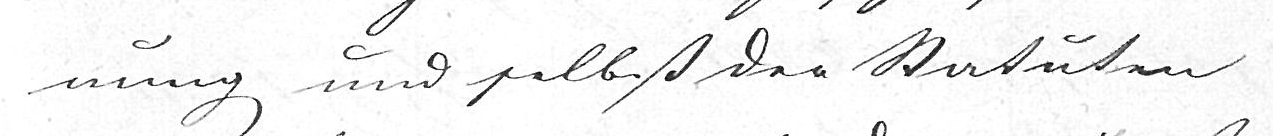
nung und selbst der Statuten
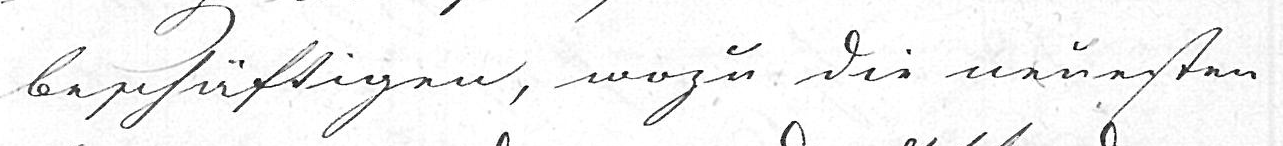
beschäftigen, wozu die neuesten
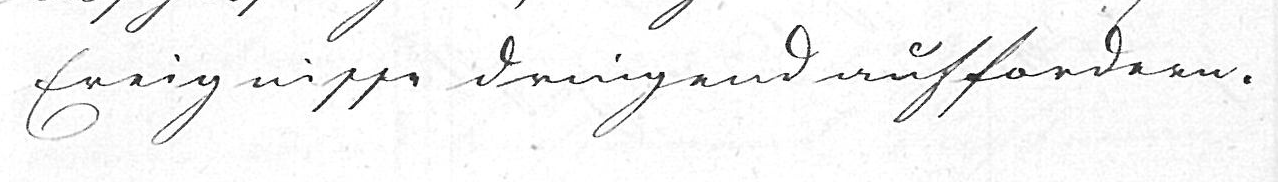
Ereignisse dringend auffordern.
